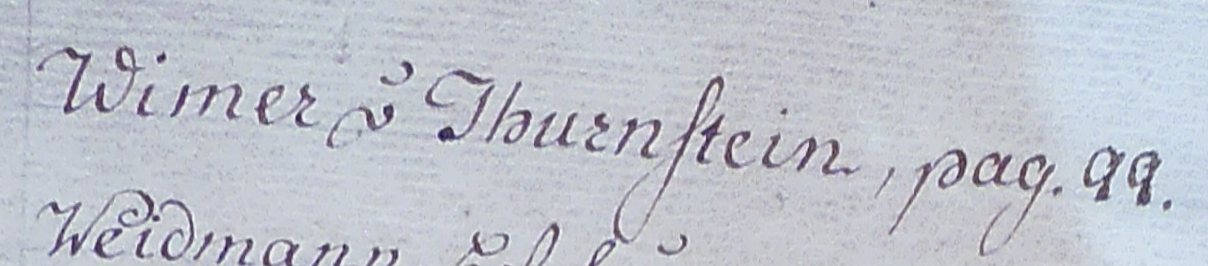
Wimer v Thurnstein, pag. 99.
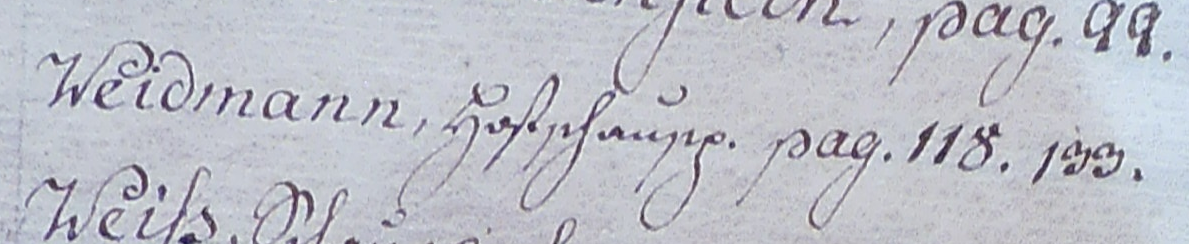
Weidmann, Hofschausp. pag. 118. 133.
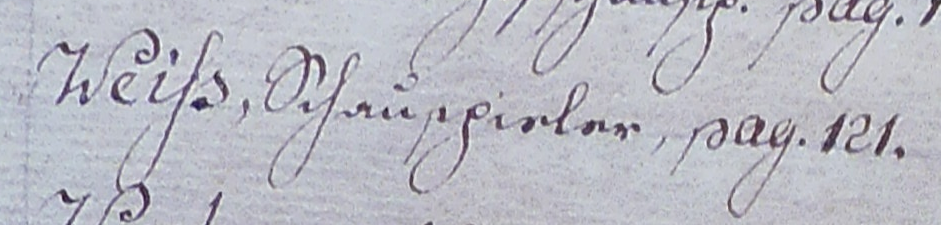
Weihs, Schauspieler, pag. 121.
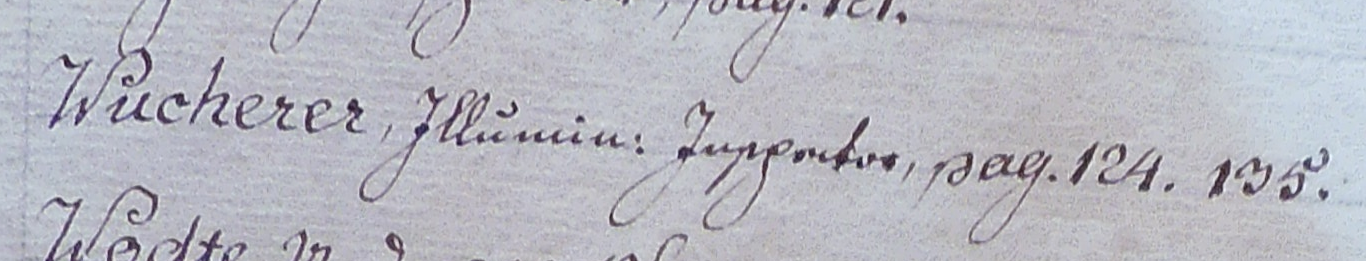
Wucherer, Illumin: Inspector, pag. 124. 135.
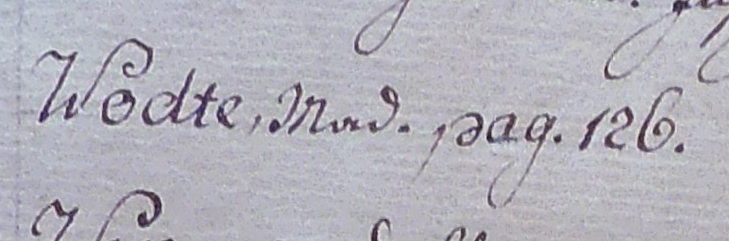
Wodte, Mad. pag. 126.
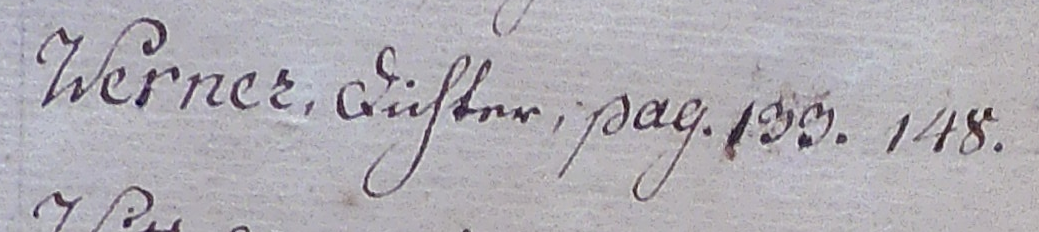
Werner, Dichter, pag. 133. 148.
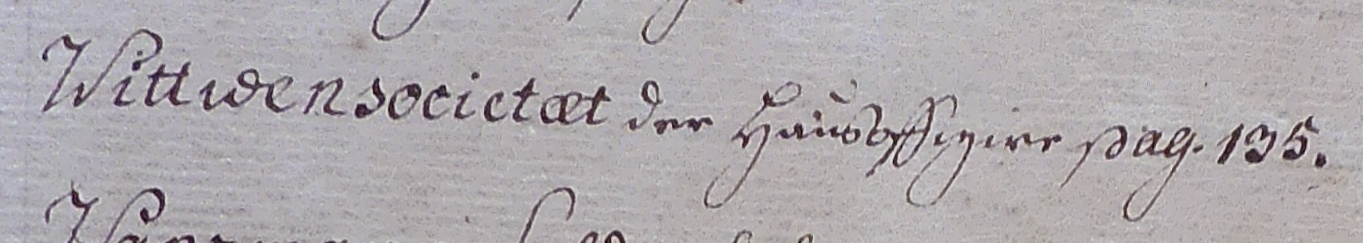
Wittwensocietæt der Hausoffizire pag. 135.
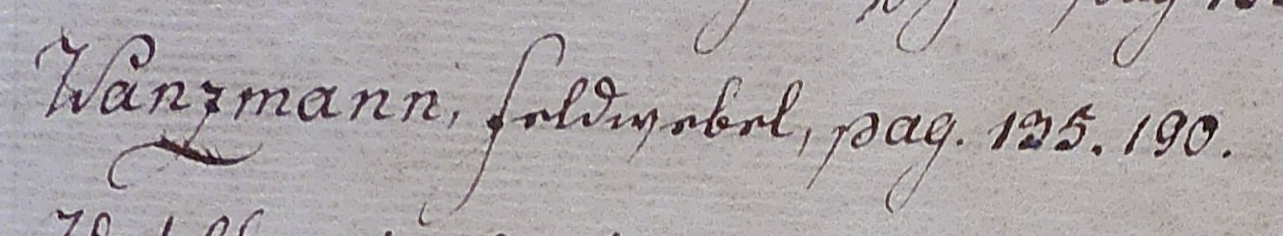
Wanzmann, Feldwebel, pag. 135. 190.
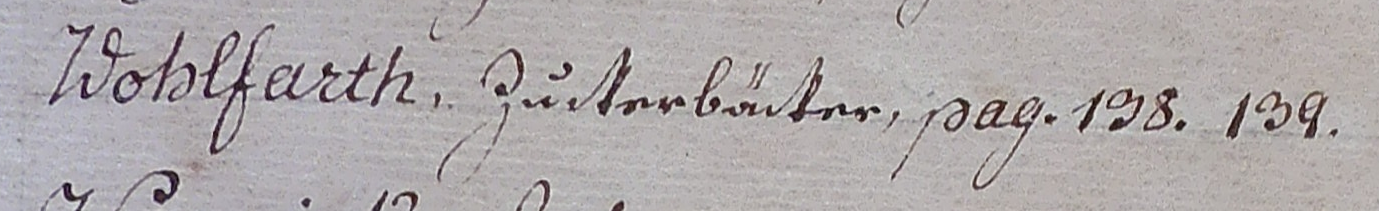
Wohlfarth, Zuckerbäcker, pag. 138. 139.
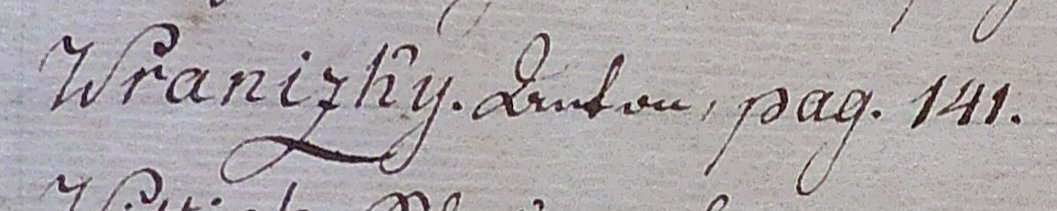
Wranizky. Anton, pag. 141.
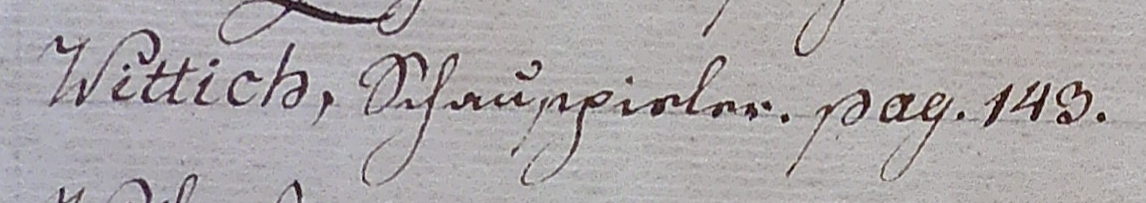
Wittich, Schauspieler. pag 143.
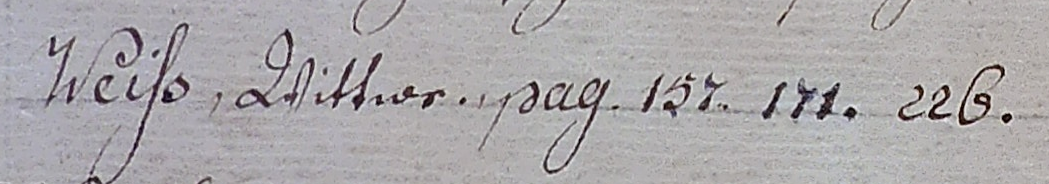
Weihs, Wittwe. pag. 157. 171. 226.
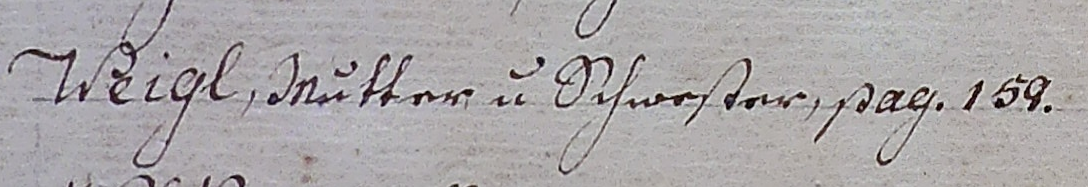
Weigl, Mutter u Schwester, pag. 159.
